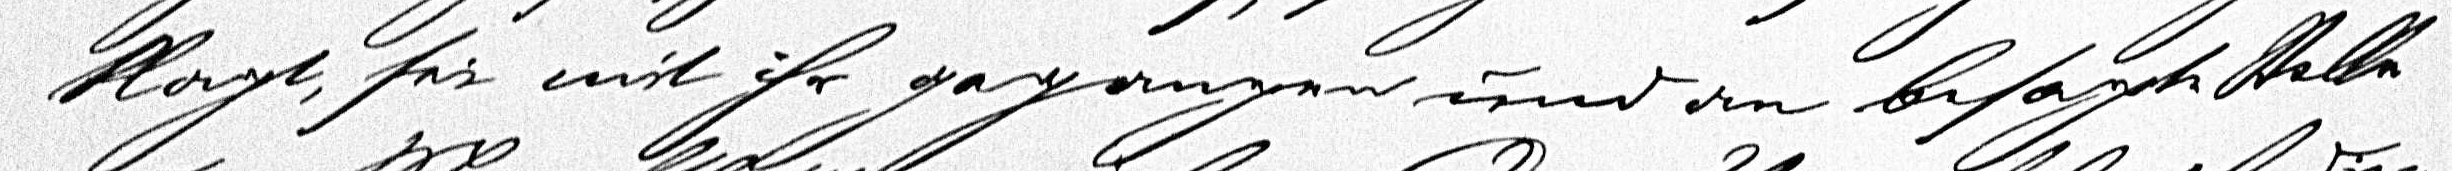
Plogt, sei mit ihr gegangen und an besaph Stelle
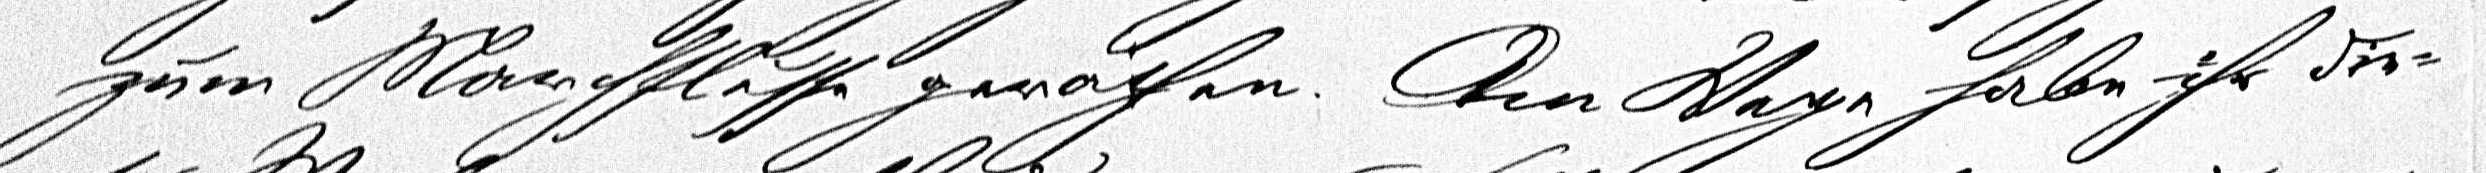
zum Marchflesse gerathen. Am Wage Habe ihr der¬
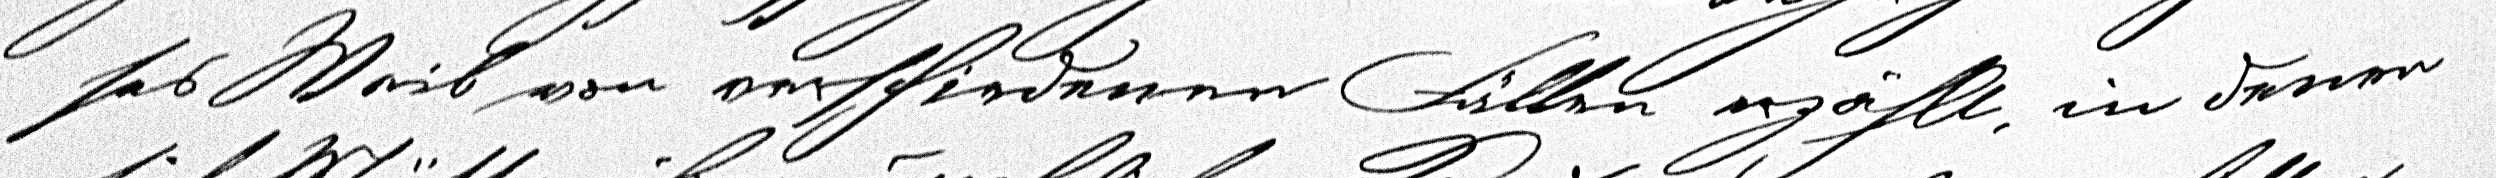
sas Weis von verschiedenen Fälben erzählt, in denen
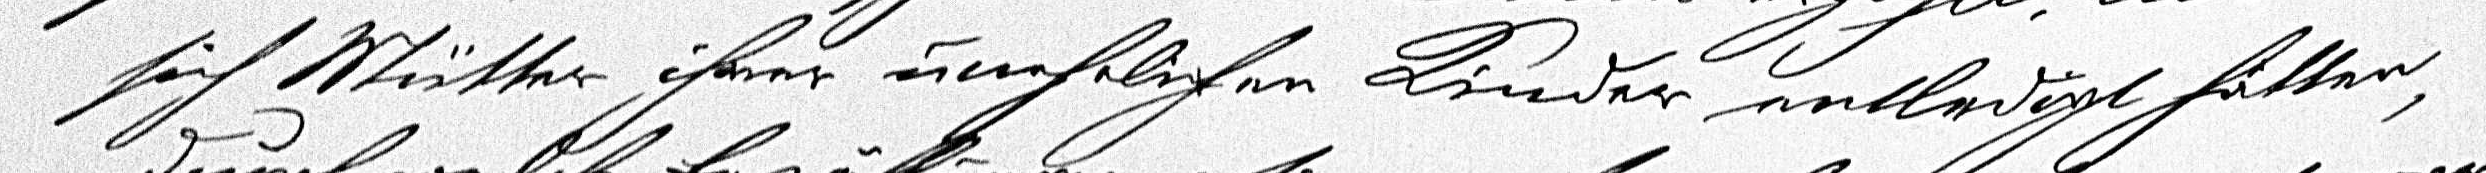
sich Mütter ihrer unchelifen Kinder entledigl Hatten,
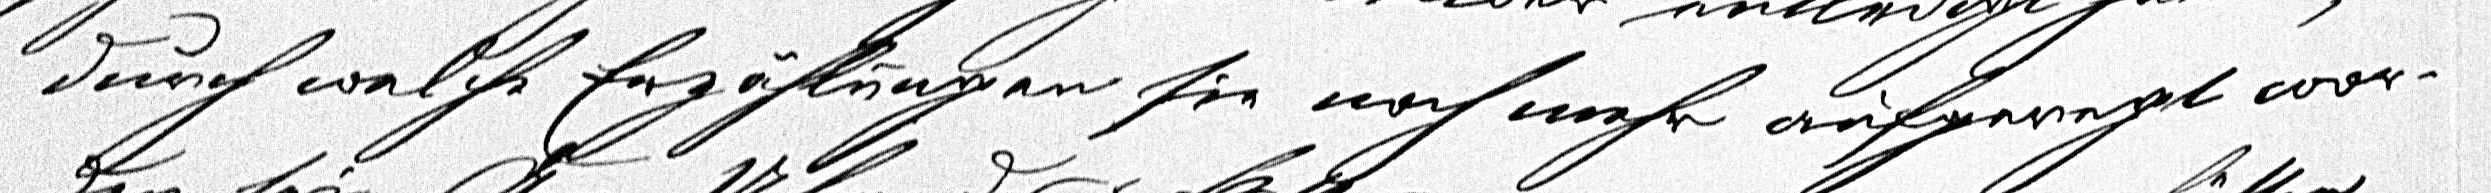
Durch walch Erzählungen sie noch wehr aufperegl wor¬
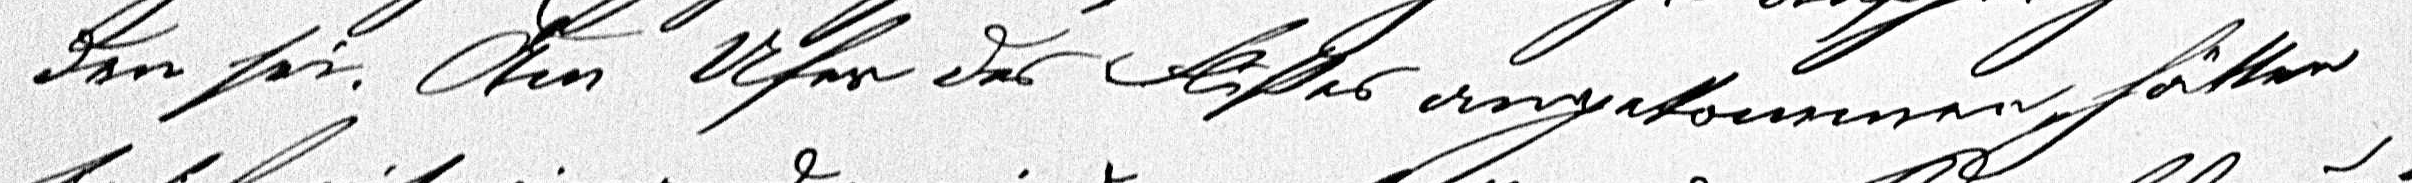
den sei. Am Ufer des Flises angekommen hätter
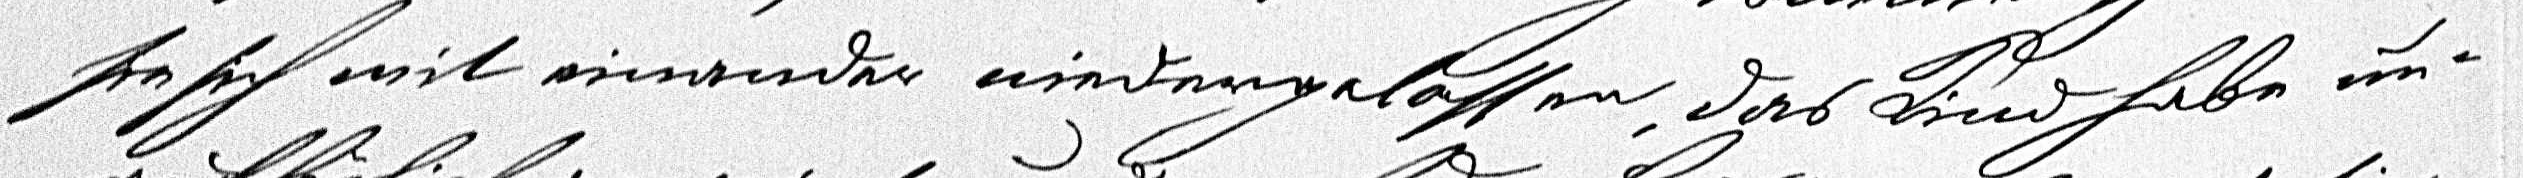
fesich mit einander einderpalassen, das Kind Habe un¬
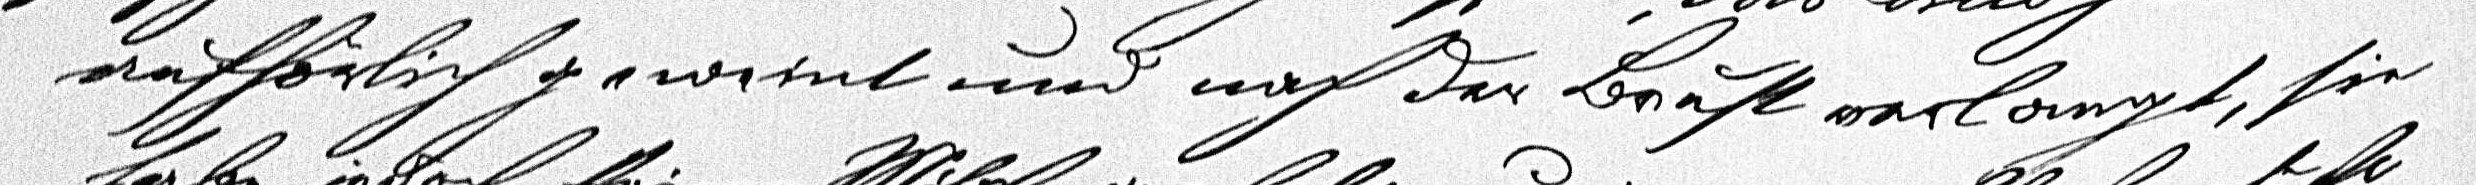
aufforlich gewint und noch der brast verlangt, sie
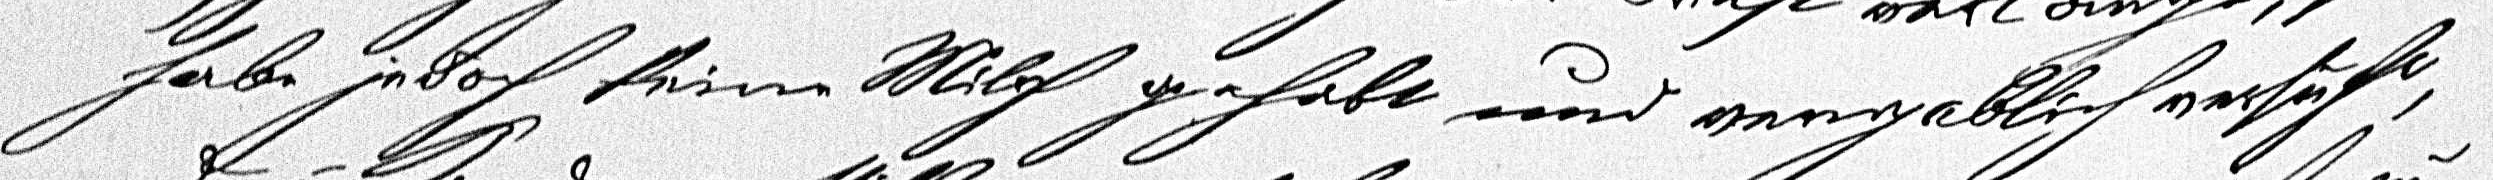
habe jedoch peim Wilch gehabe und vergablich verhähl,
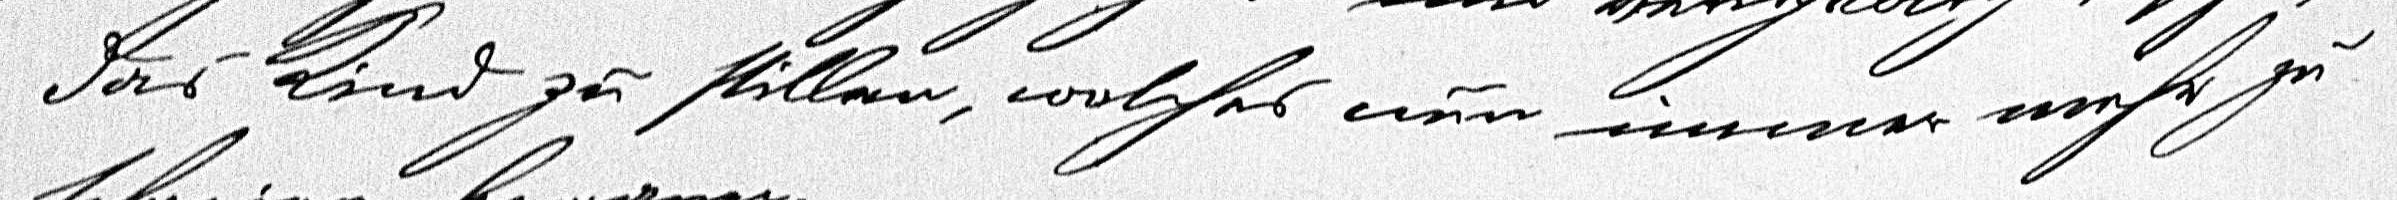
das kind zu stillen, wolches nun einmer wehr zu
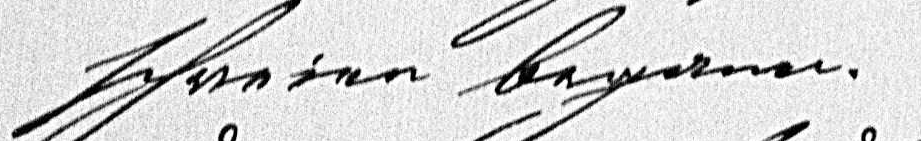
schweien begaen
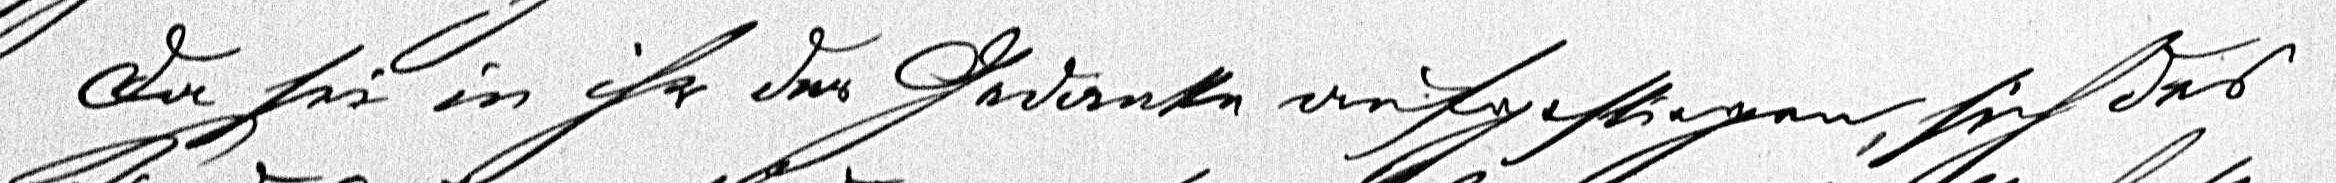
Da sie in ihr der Gedanke aufgesliegen, sich des
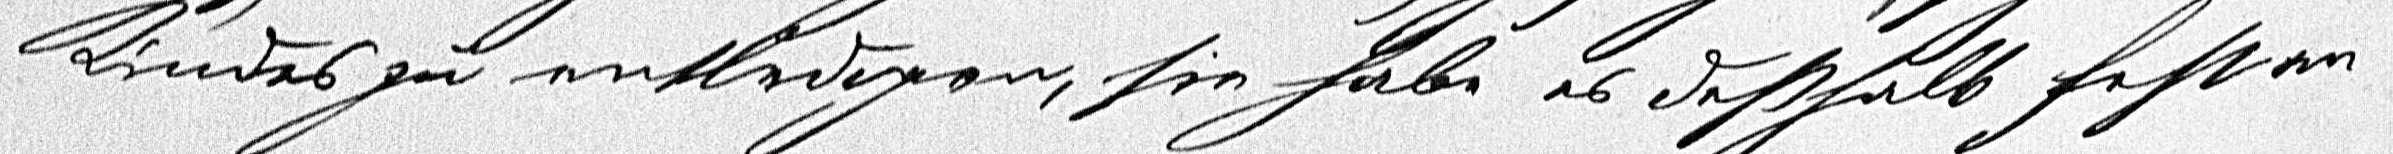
Kindes zu entledepon, sie Habe as desselb fessen
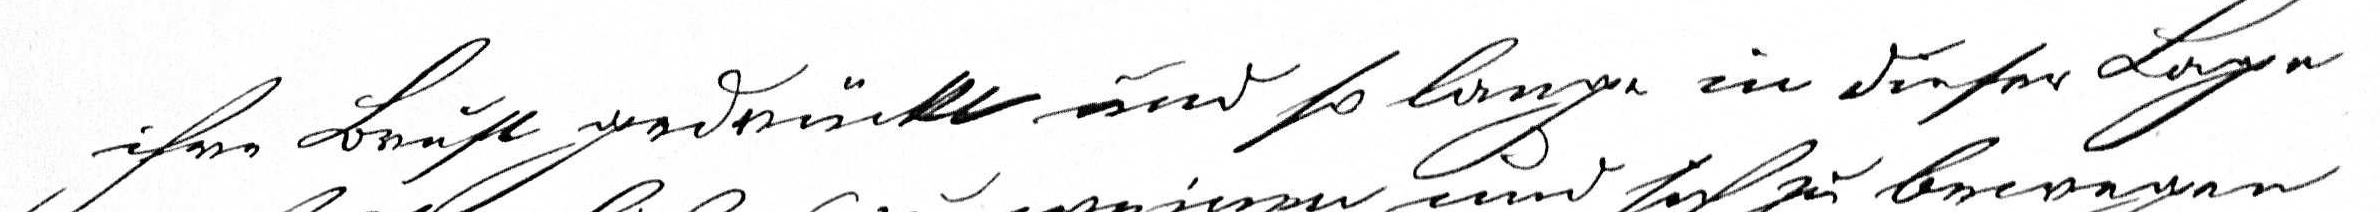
ihre Brust gedrückt und so lange in dieser Lage
